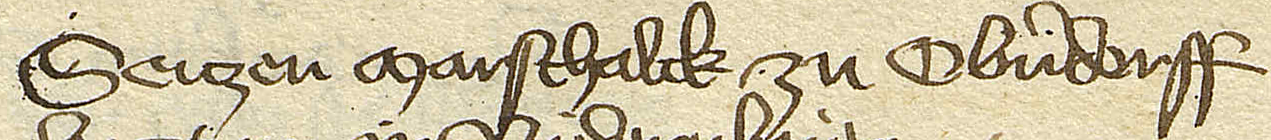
Seicʒen Marſchalck cʒu Obn*dorff
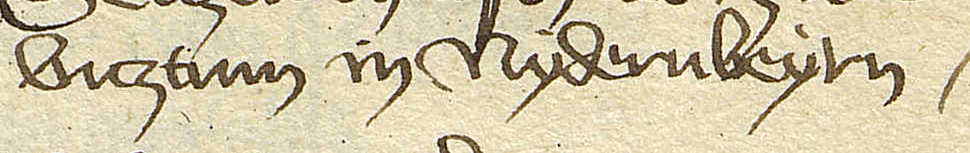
vicʒtum in Nydernbeyrn /
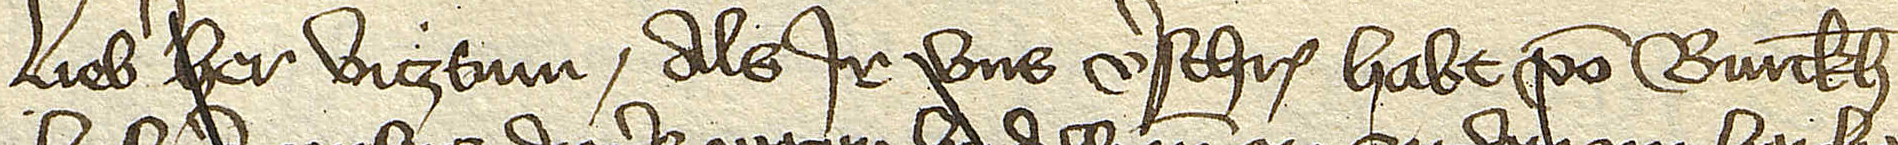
Lieb* her vicʒtum / Als Ir vns v*ſchr* habt vo* Burckh*
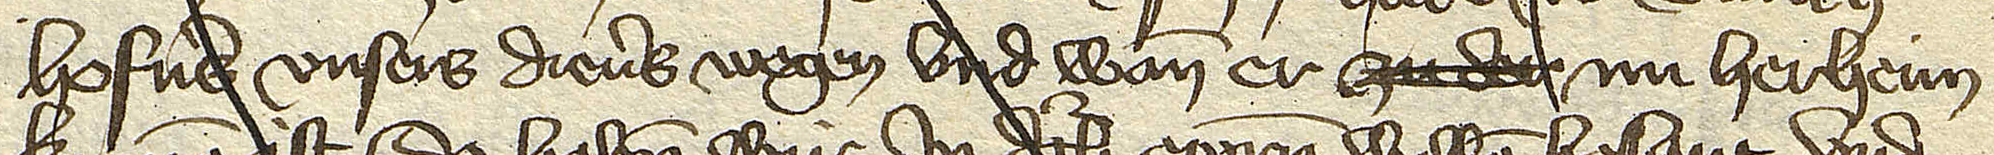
hofns* vnſers dien*s wegen vnd wan* er cʒu der nu herheim
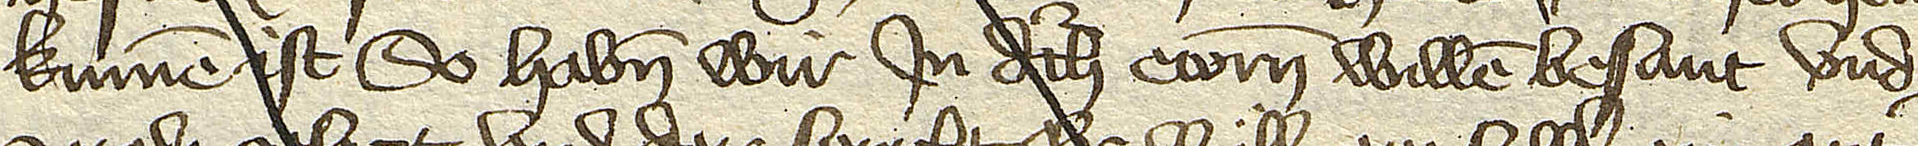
kume* iſt So habn* wir In d*ch ewrn* wille* beſant vnd
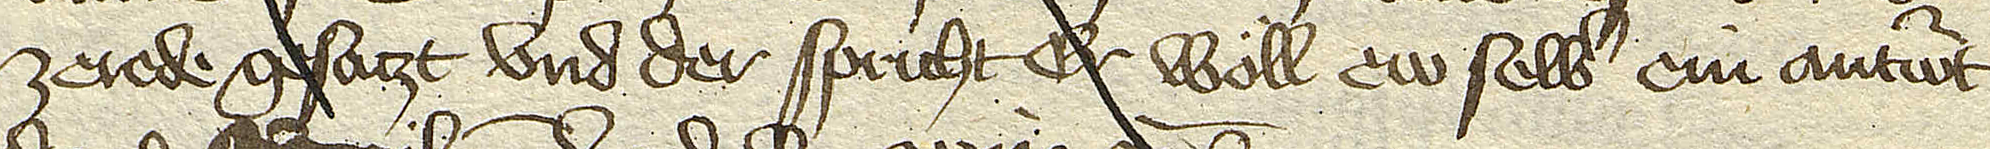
cʒerede geſacʒt vnd der ſpricht Er wöll ew ſelb* ein antwt*
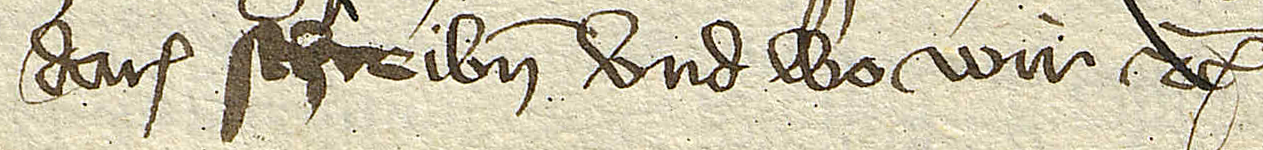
dar* ſchreibn* vnd wo wir ec*
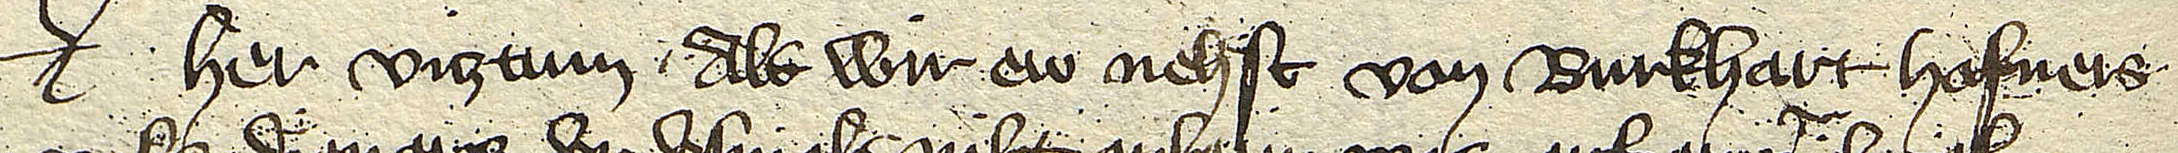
L* her vicʒtum / Als wir ew nehſt von Burkhart hofners
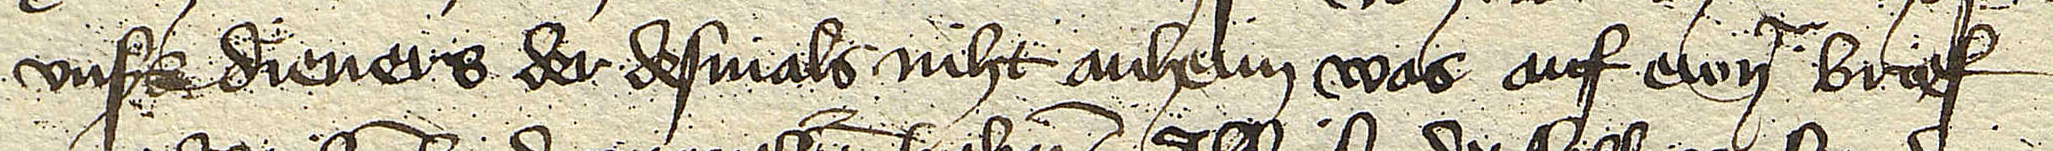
vnſ*s dieners der deſmals niht anheim was auf ewn* brief
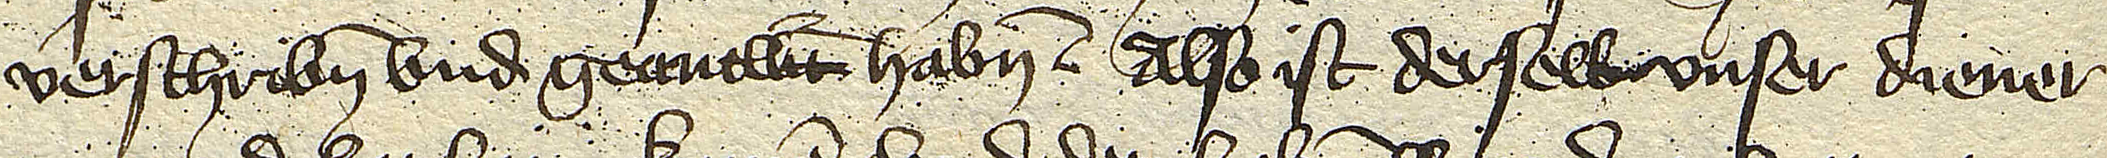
verſchribn* vnd geantwt* habn* / Alſo iſt derſelb* vnſer diener
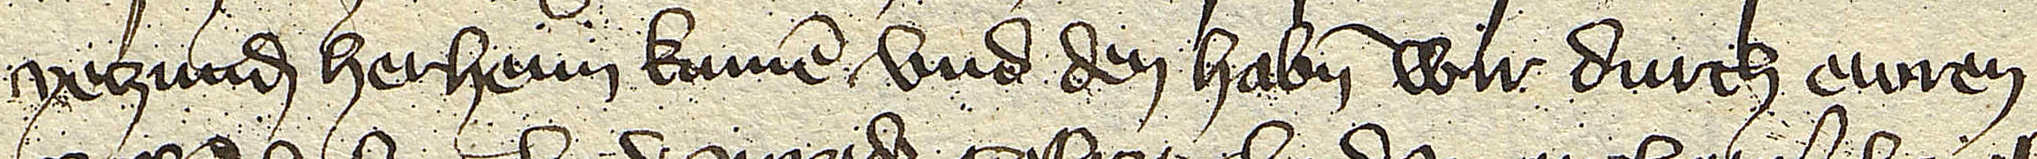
yecʒund* herheim kume* / vnd den habn* wir durch ewren
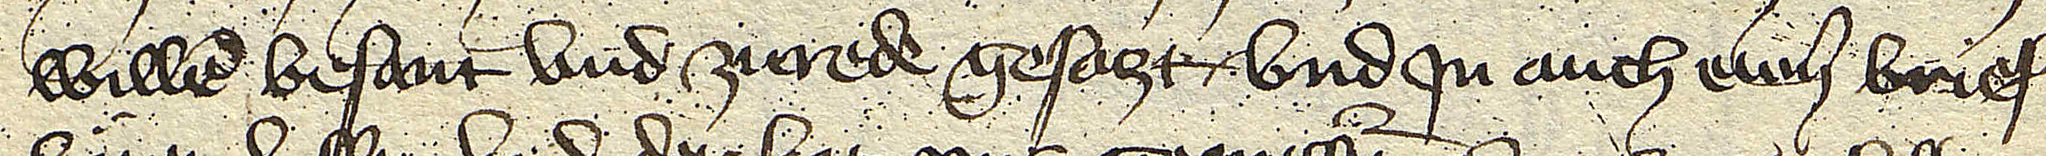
wille* beſant vnd cʒurede geſacʒt / vnd In auch ewn* brief
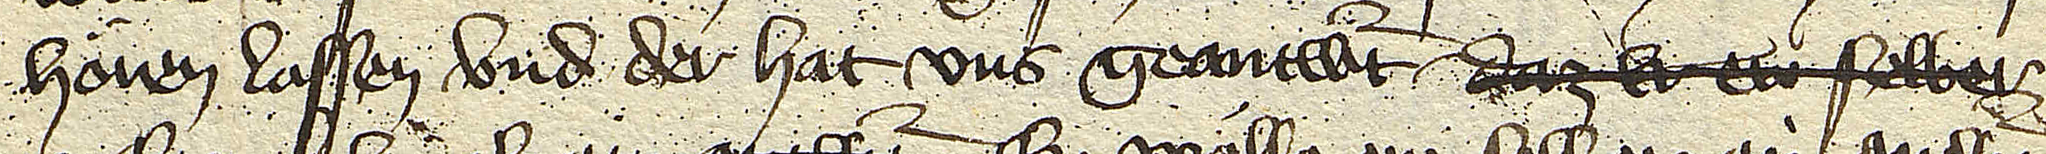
hören laſſen / vnd der hat vns geantwt* / daʒ Er ew ſelber
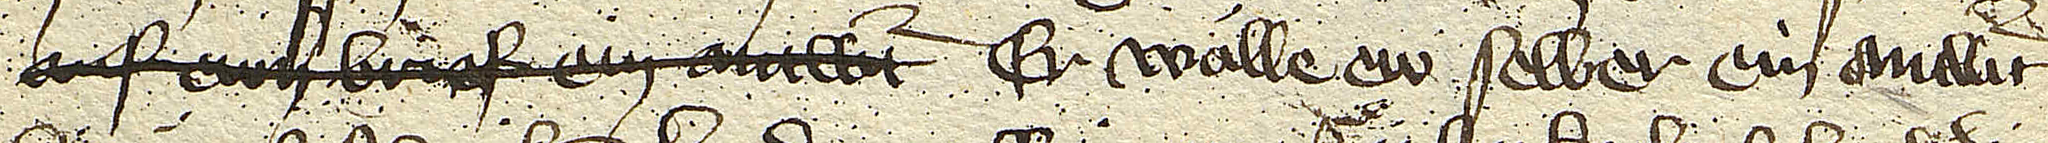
auf ewn* brief ein antwt* Er wölle ew ſelber ein antwt*
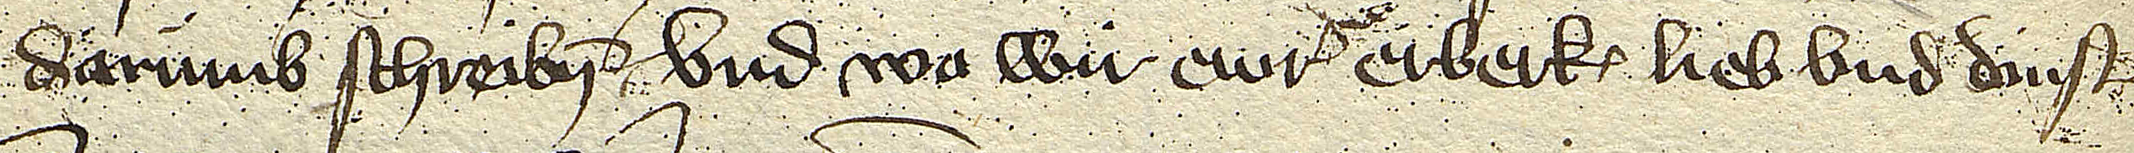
darümb ſchreibn* / vnd wo wir ewr* erberk* lieb vnd dinſt
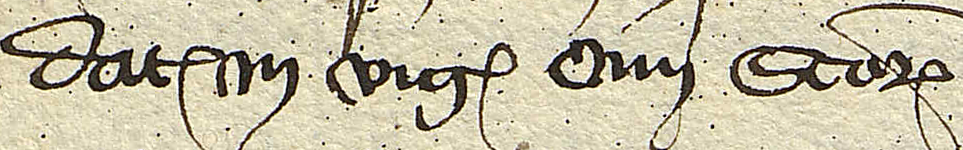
dat* in vig* Omi* Sco*
